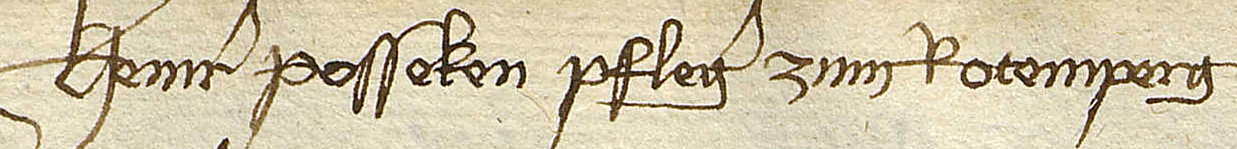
Heinr* Poſſeken pfleg* ʒum Rotemperg
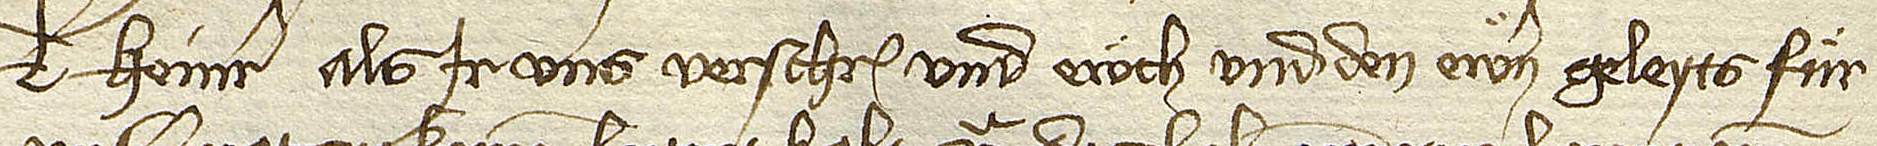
L* Heinr* als Ir vns verſchr* vnd ewch vnd den ew*n geleyts für
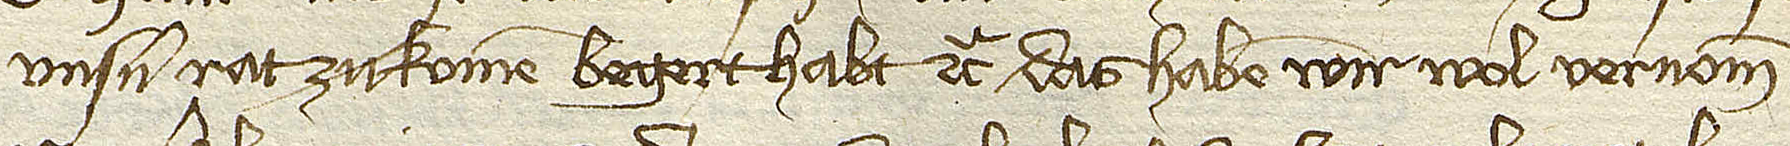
vnſ*n rat ʒukome* begert habt ec / das habe* wir wol vernom*
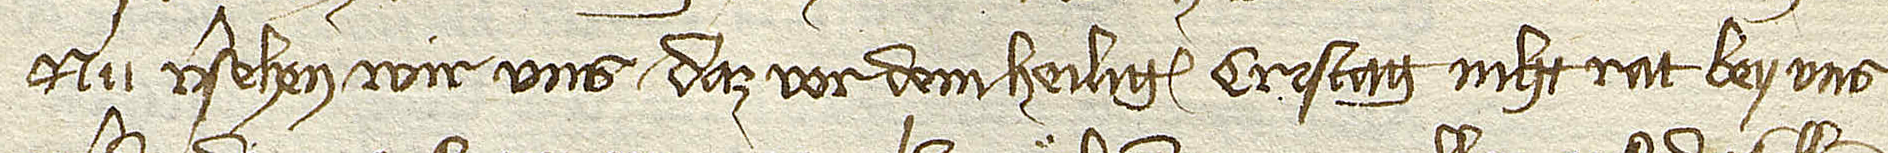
Nu v*ſehen wir vns / daʒ vor dem heilig* Criſtag niht rat bey vns
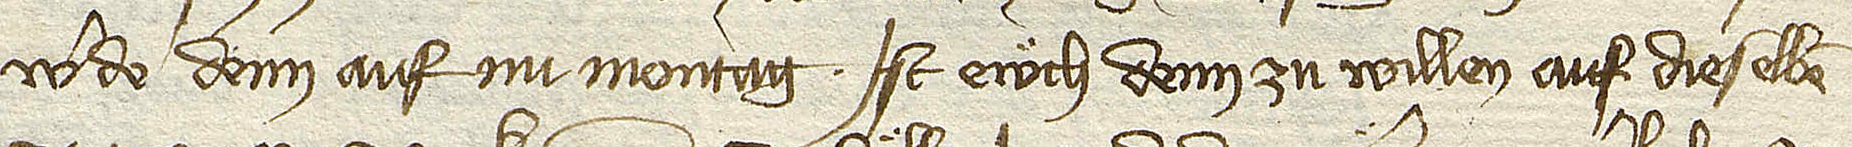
w*de denn auf nu montag . Iſt ewch denn ʒu willen auf dieſelbe*
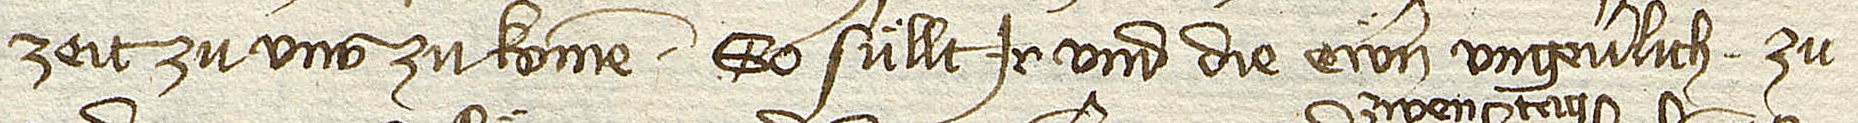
ʒeit ʒu vns ʒu kome* . So ſüllt Ir vnd die ew*n vngeu*lich . ʒu
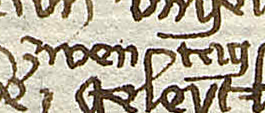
ʒwen tag
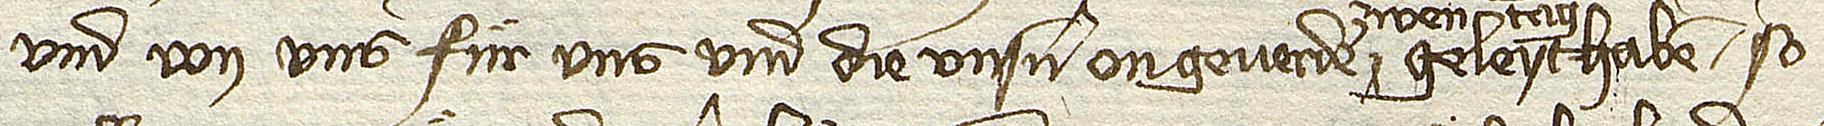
vnd von vns für vns vnd die vnſ*n ongeuerde geleyt habe* / ſo
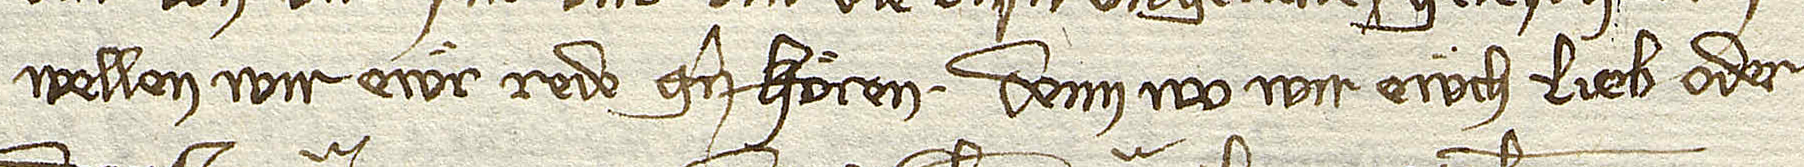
wellen wir ewr rede g*n hören . Denn wo wir ewch lieb oder
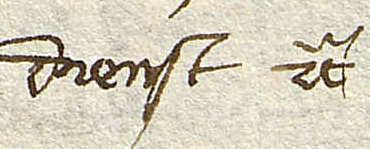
dienſt ec*
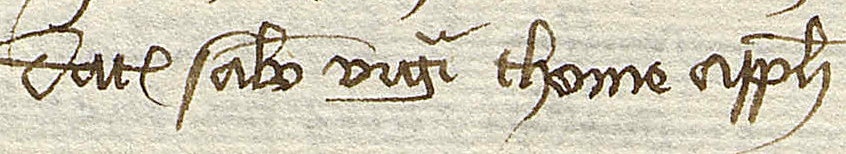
Dat* ſabo* vigi* thome appli*
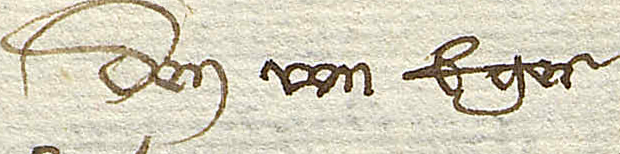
Den von Eger
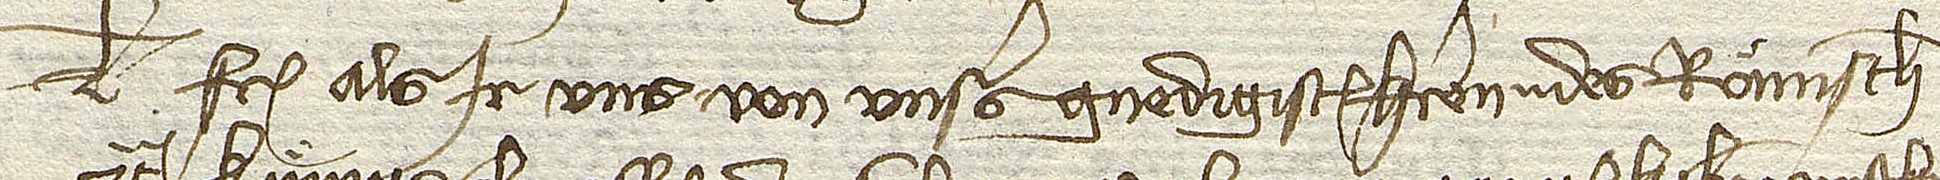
L* fr* als Ir vns von vnſ*s gnedigiſt* h*ren ~ des Römiſch*
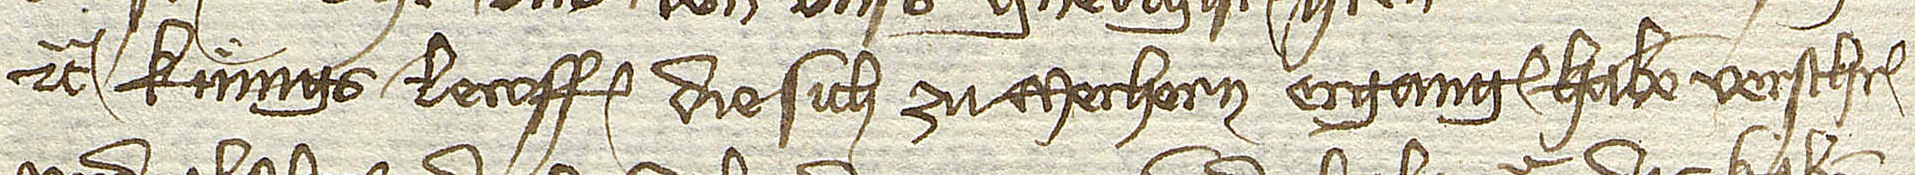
ec* künigs lewff* die ſich ʒu Merhern ergang* habe* verſchr*
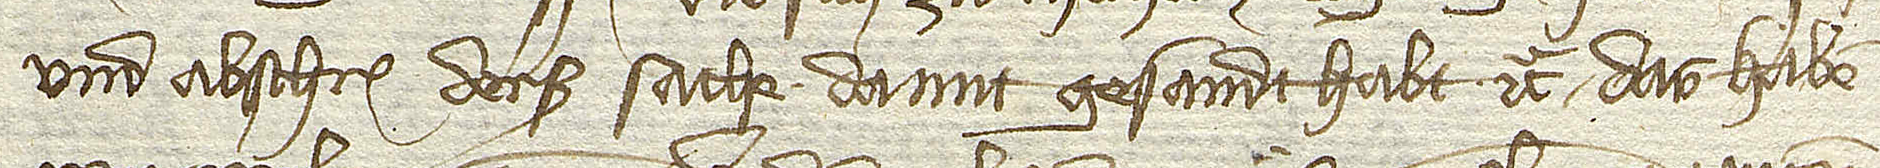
vnd abſchr* derſ* ſache . damit geſandt habt ec* / das habe*
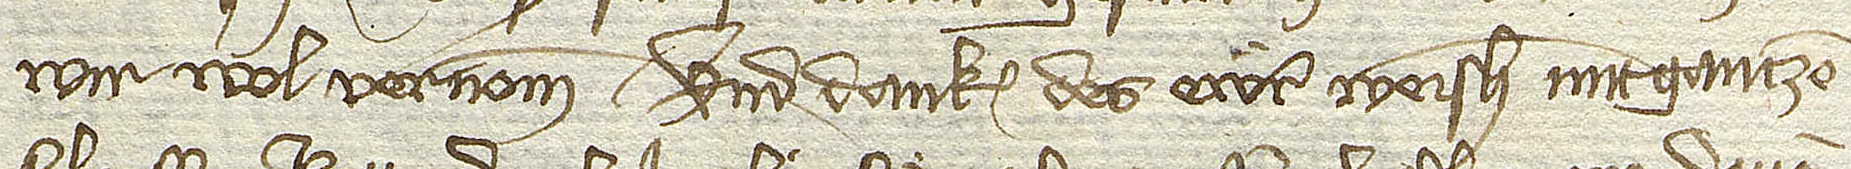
wir wol vernom* / Vnd dank* des ew*r weiſh* mit gancʒe*
